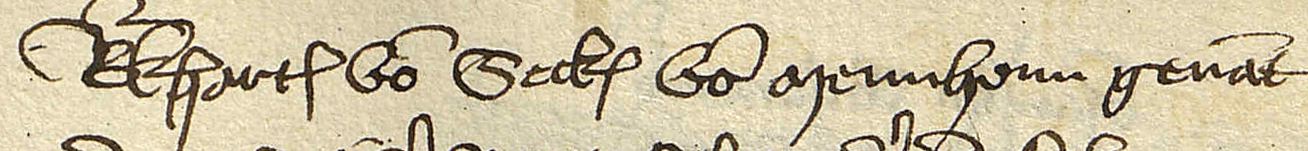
B*khart* vo* Seck* vo* Mennheim genat*
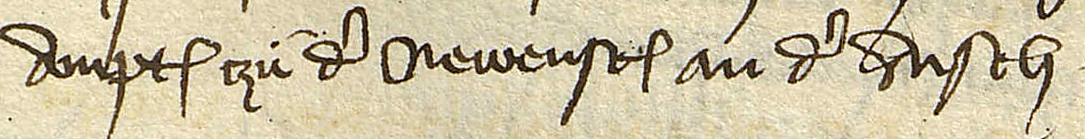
Ampt* cʒü d* Newenſt* an d* Aiſch*
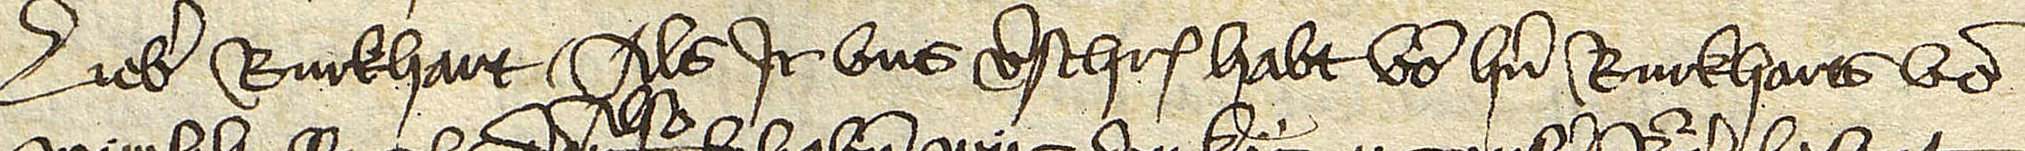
Lieb* Burkhart / Als Ir vns v*ſchr* habt vo* hn* Burkharts vo*
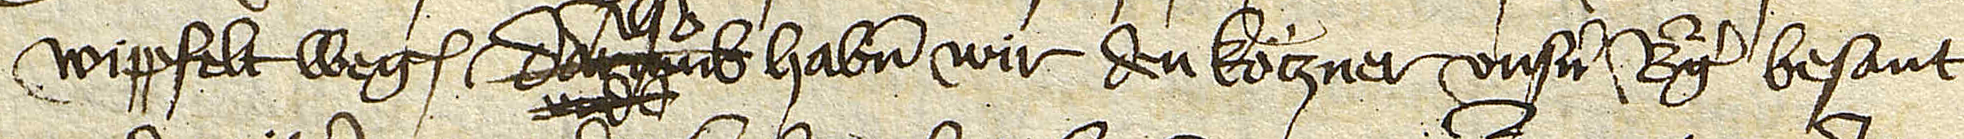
wippfelt weg* / Darvmb habn* wir den köcʒner vnſn* B*g* beſant
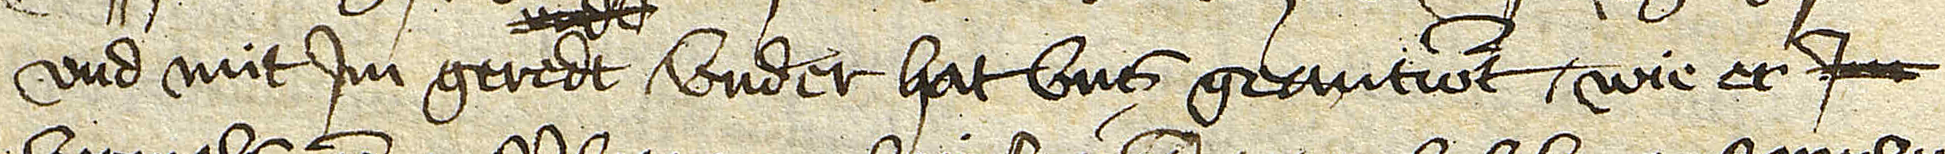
vnd mit Im geredt / vnd er hat vns geantw*t / wie er Im
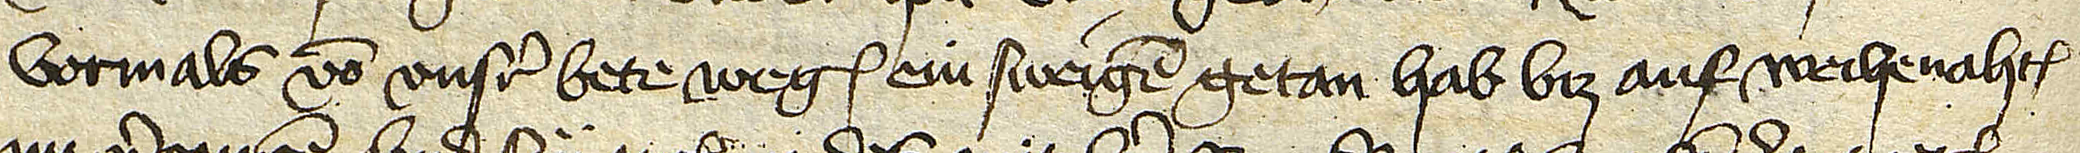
vormals vo* vnſr* bete weg* ein ſweige* getan hab biʒ auf weihenaht*
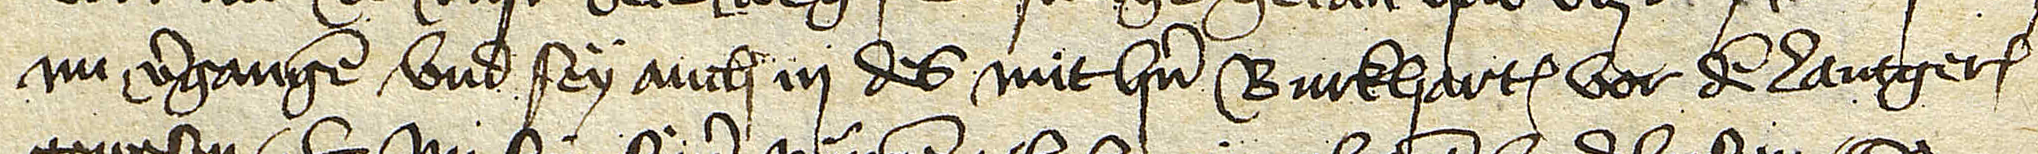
nu v*gange* / vnd ſey auch in des mit hn* Burkhart* vor d* Lantger*
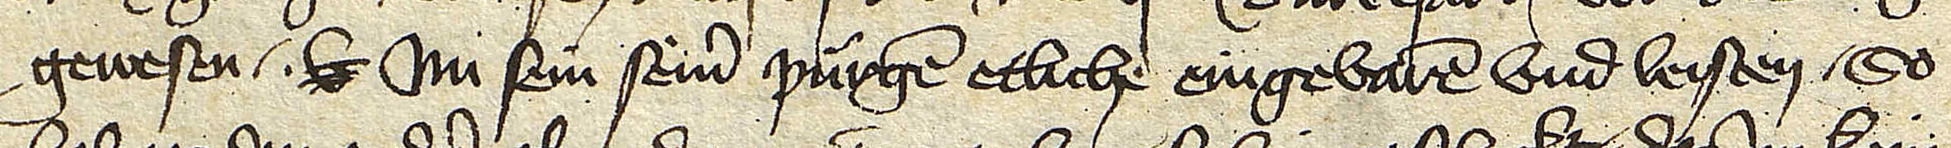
geweſen / . v Nu ſein ſein* pürge* etliche eingevare* vnd leiſten / So
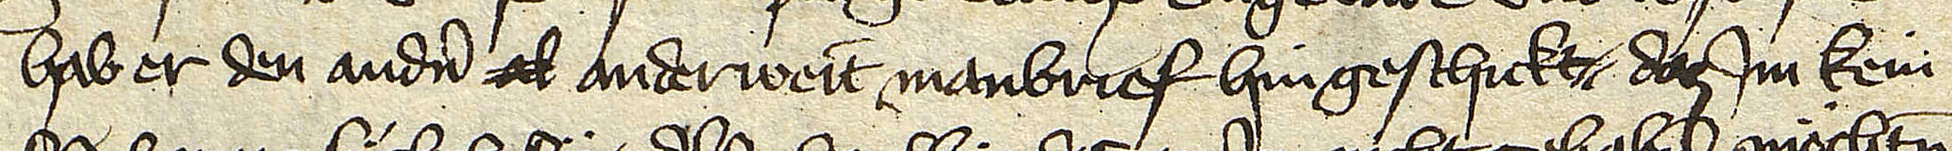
hab er den andn* al anderweit manbrief hingeſchickt / daʒ Im kein
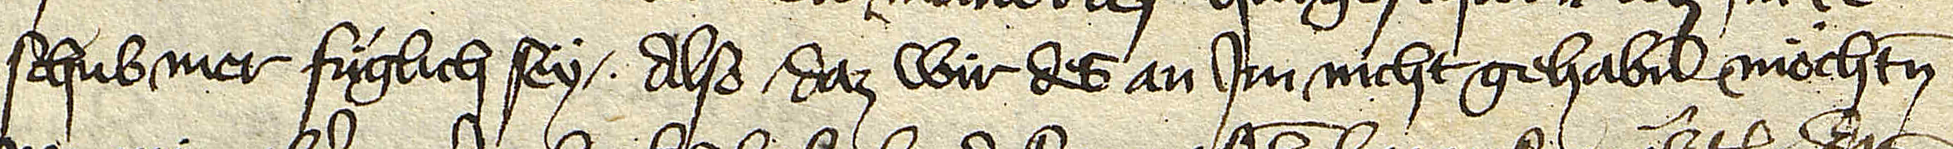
ſchub mer füglich ſey / . Alſo / daʒ wir des an Im nicht gehabn* möchtn*
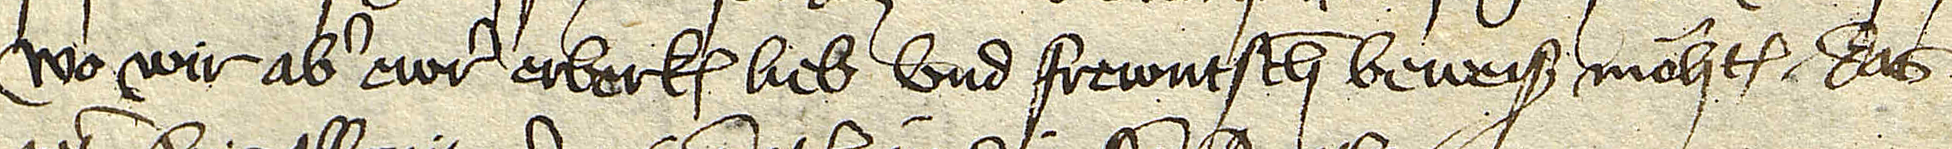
wo wir ab* ewr* erberk* lieb vnd frewntſch* beweiſ* möht* / das
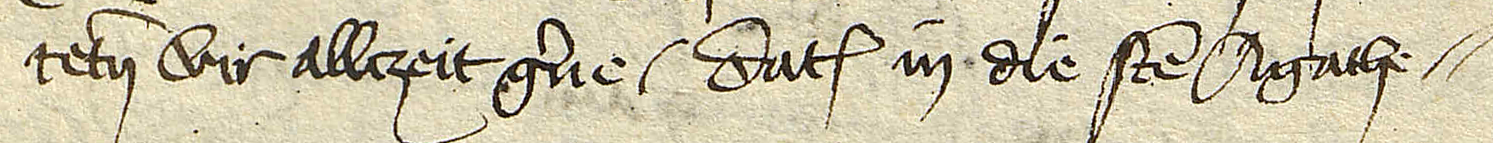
tetn* wir allcʒeit g*ne / Dat* iii die ſte* Agathe /
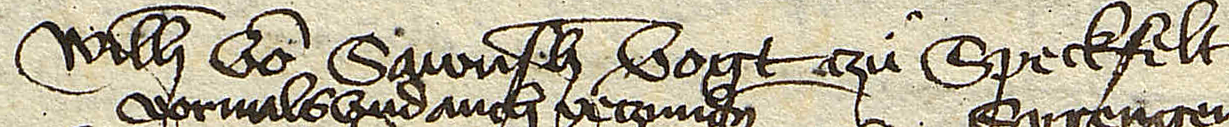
wilh* vo* Sawnſh* / vogt cʒü Speckfelt
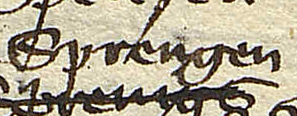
Sprengen
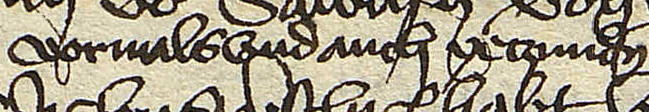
vormals vnd auch yecʒundn*
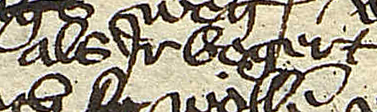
als Ir begert
